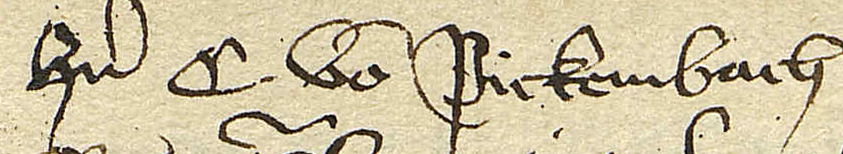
hn* C . vo* Pickembach
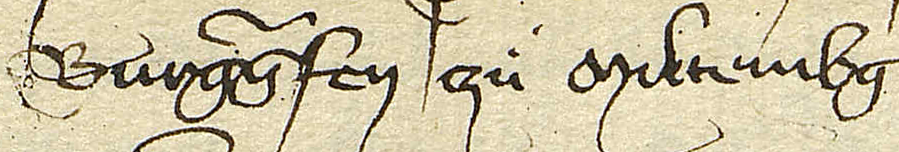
Burgg*fen cʒü Miltembg*
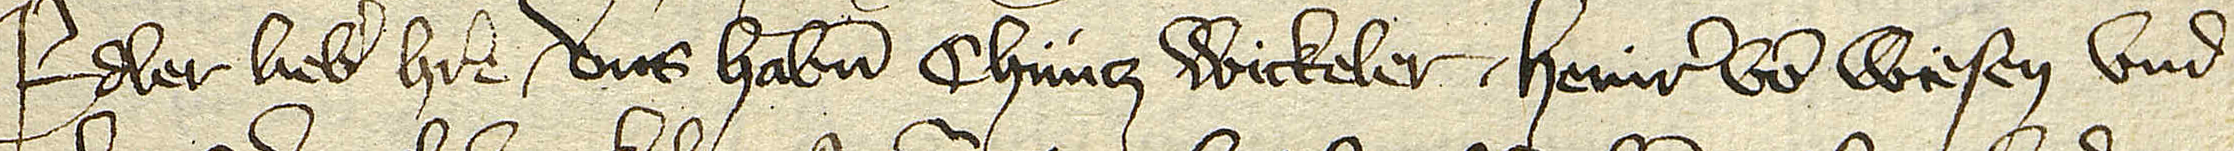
Edler lieb* hr*e / Vns habn* Chüncʒ Wickeler / Heinr* vo* wieſen vnd
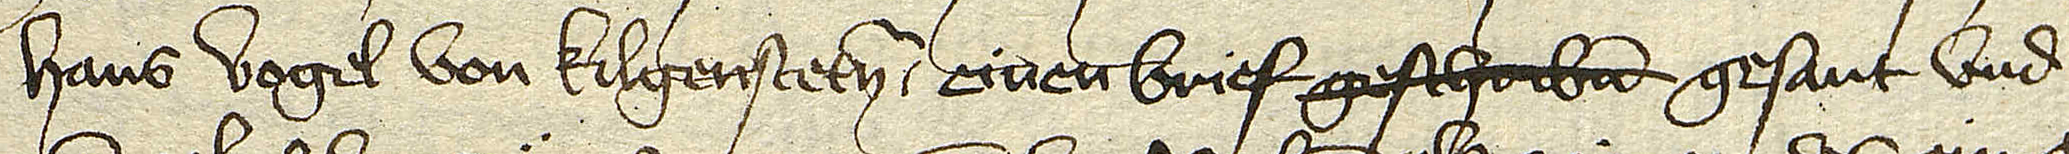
hans Vogel von kilgenſtetn* / einen brief geſchribn* geſant vnd
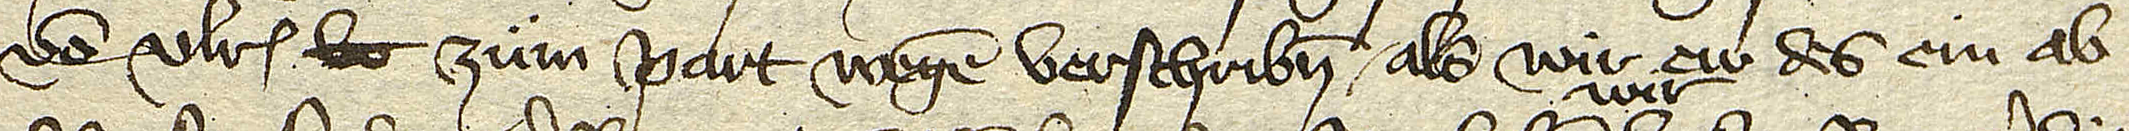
vo* vlr* vo cʒüm Part wege* verſchribn* / als wir ew des ein ab
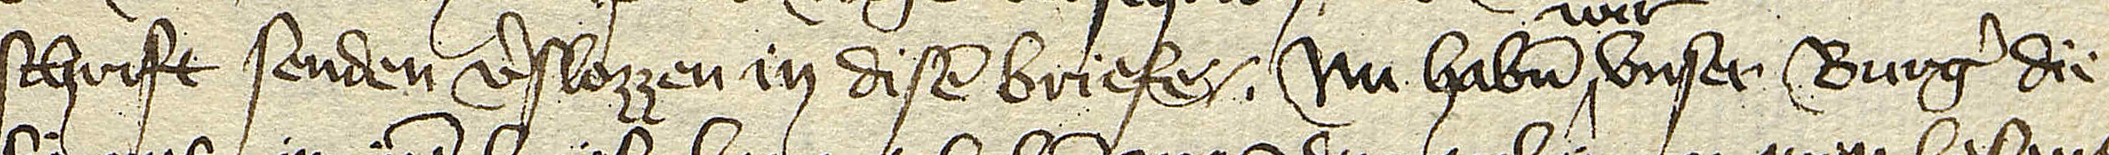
ſchrift ſenden v*ſloʒʒen in diſe* briefe / . Nu habn* vnſer Burg* die
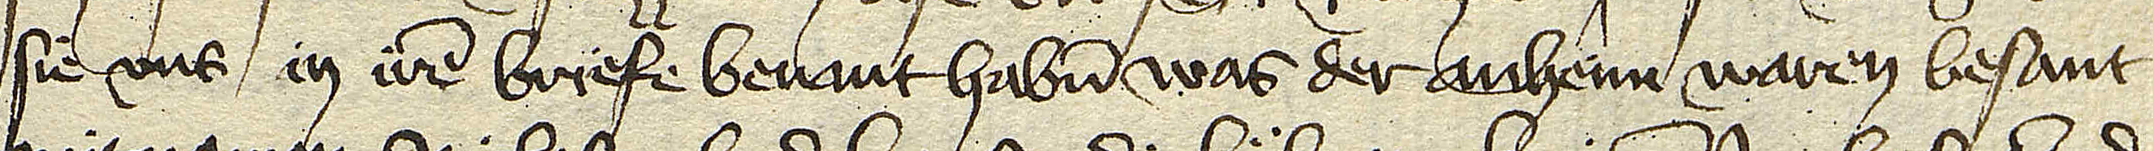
ſie vns in ire* briefe benant habn* was der anheim waren beſant
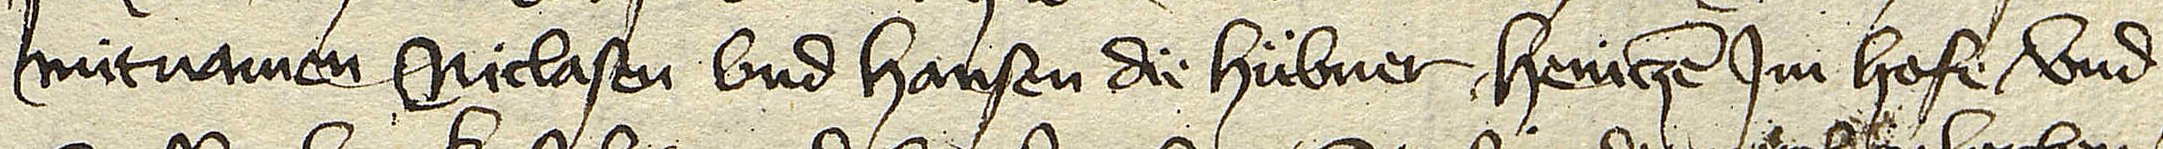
mitnamen Niclaſen vnd hanſen die hübner / heincʒe* Im hofe / vnd
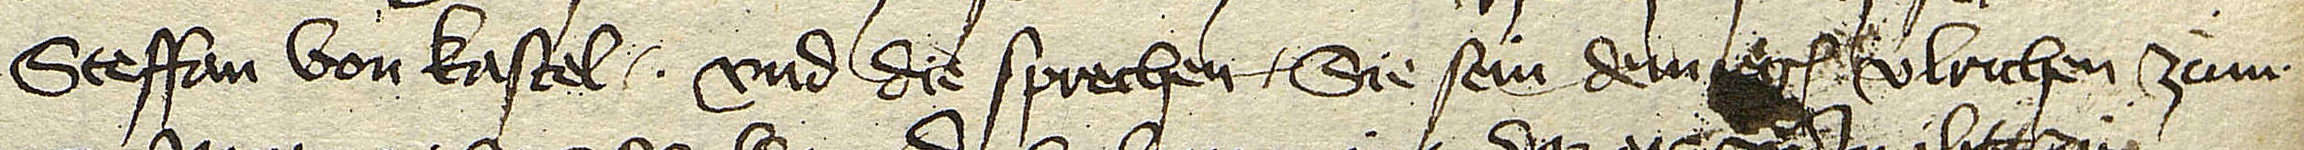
Steffan von kaſtel / . vnd die ſprechen / Sie ſein dem eg* vlrichen cʒüm
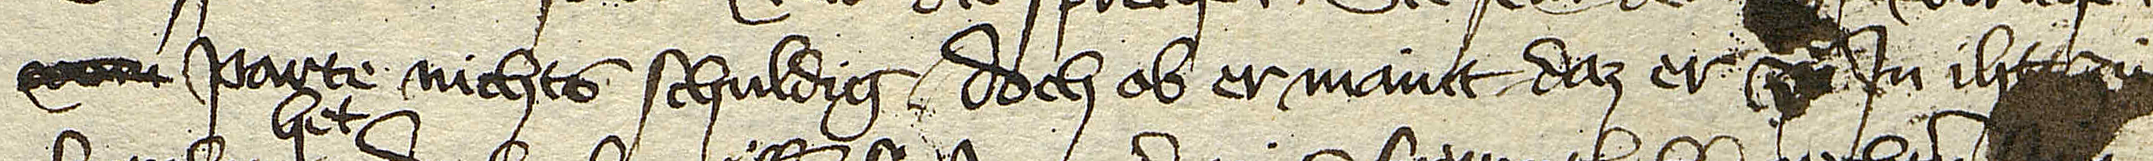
vom Parte nichts ſchuldig / doch ob er maint / daʒ er cʒü In iht cʒü
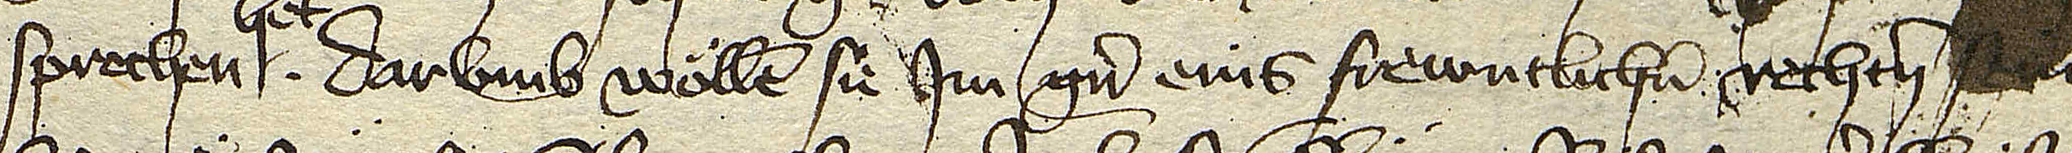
ſprechen / . darvmb wölle* ſie Im gn* eins frewntlichn* rechtn* ſein
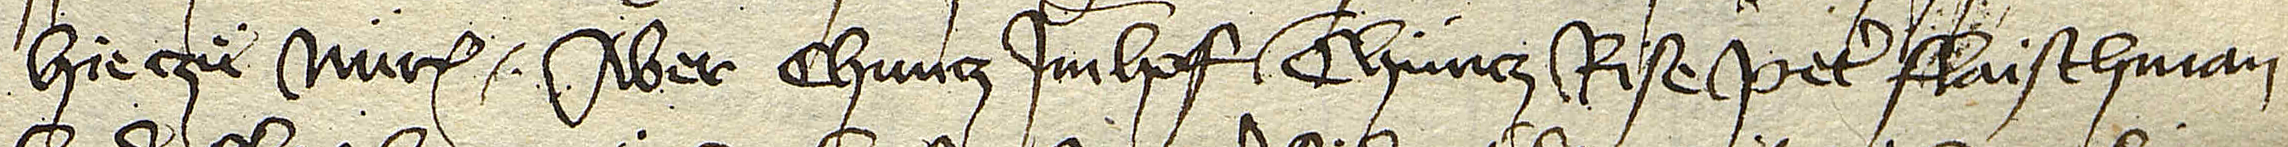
hie cʒü Nür* / . Aber Chuncʒ Imhof / Chüncʒ Riſe Pet* Flaiſchman
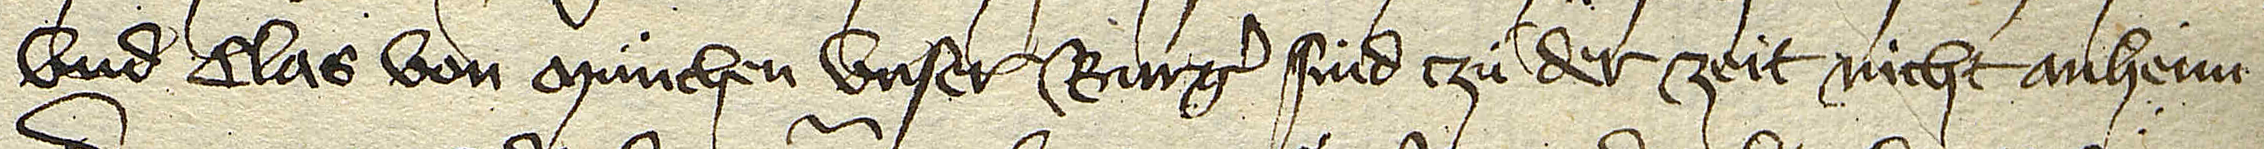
vnd Clas von München vnſer Burg* ſind cʒü der cʒeit nicht anheim
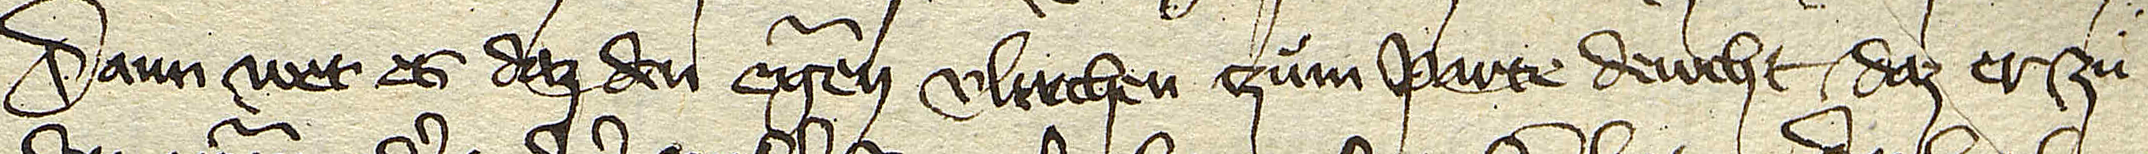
Dann wer es daʒ den egen* vlrichen cʒüm Parte dewcht / daʒ er cʒü
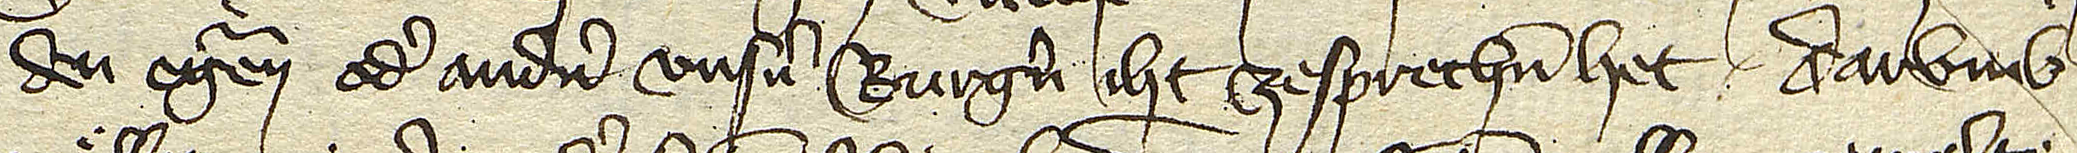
den egen* od* andn* vnſn* Burg*n iht cʒeſprechn* het / Darvmb
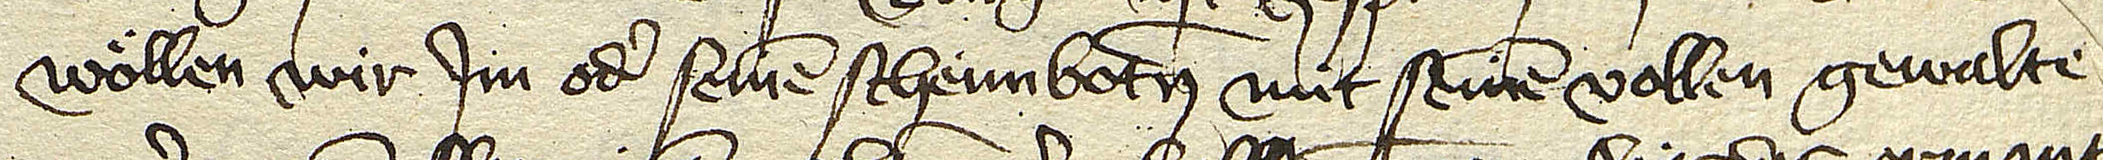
wöllen wir Im od* ſeine* ſcheimbotn* mit ſeine* vollen gewalte
